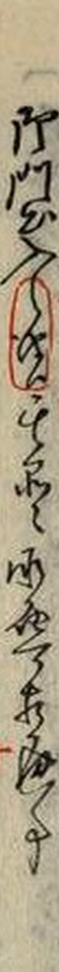一御門出入前々之通其品々承届可相通事
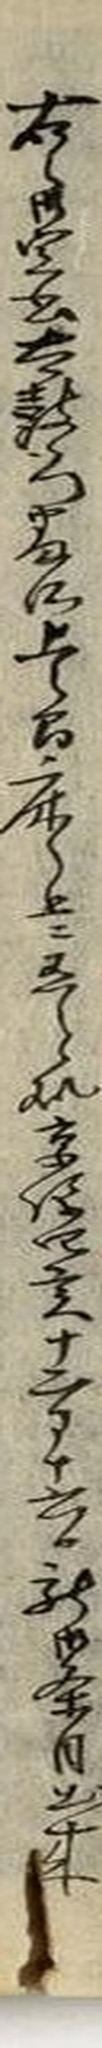右之御定書太鼓御門番所上之間床之上ニ有之候処享保四亥十二月十六日新御条目出来
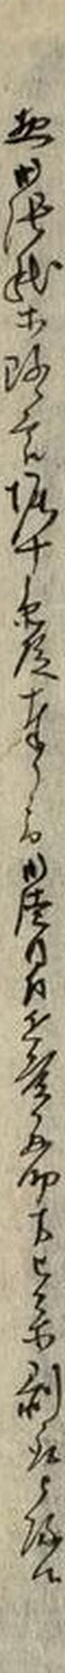惣御張紙等改候節堀十兵衛殿奉りニ而御徒目付近藤多助方被参剥取被帰候
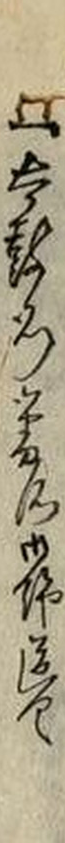一太鼓御門御番所御飾道具
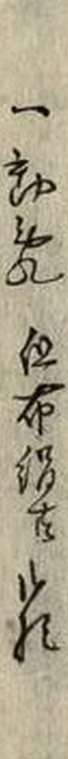一動乱但布絹共弐拾
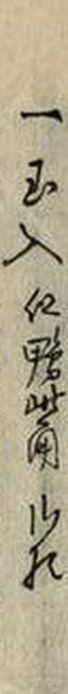一玉入但鴨觜弐拾
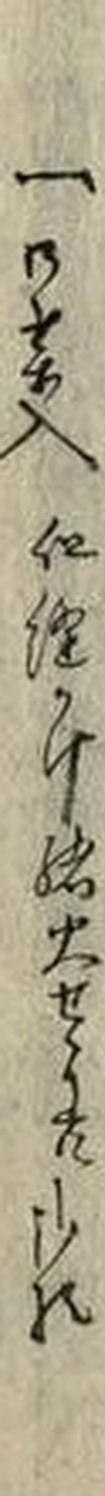一口薬入但縫かけ緒火せゝり共弐拾
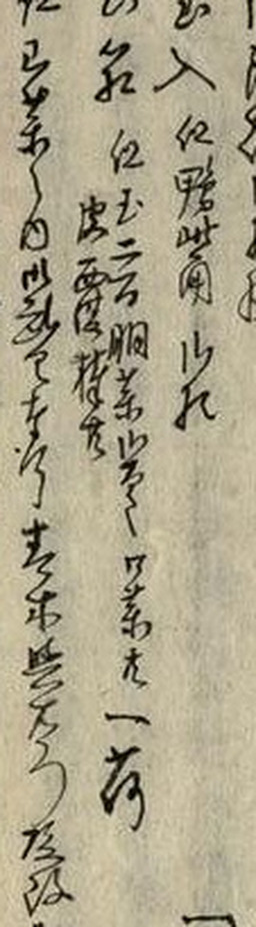一玉箱但玉二百胴薬弐百匁口薬共一荷
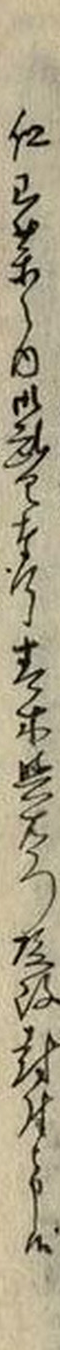但玉薬之内御武具奉行青木与左衛門殿改封付被申候
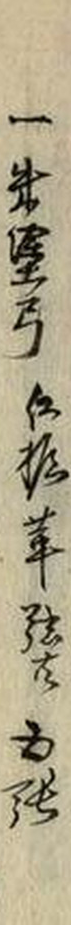一朱塗弓但握革弦共五張
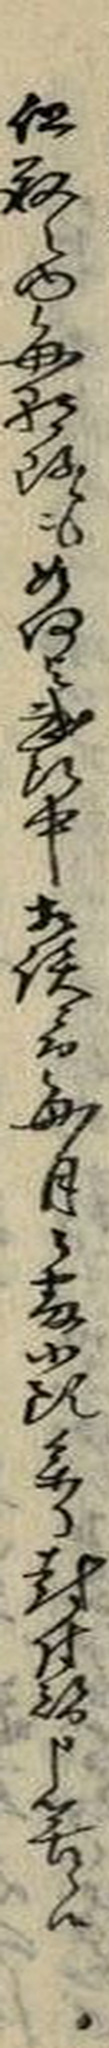但靫之内毎朝改候も如何と武頭中相談ニ而毎月々番小頭参り封付替申筈ニ候
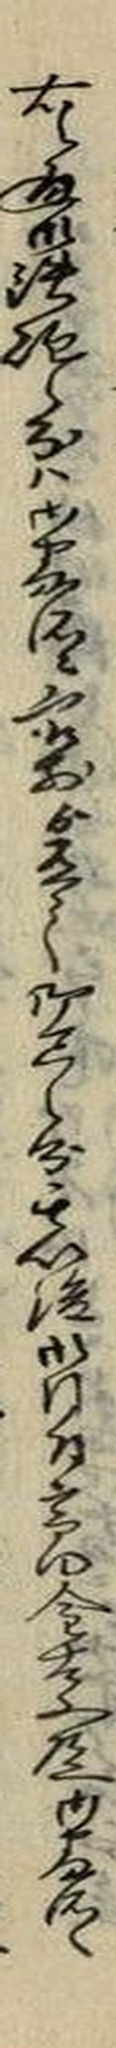右之通御鉄砲之分ハ御番所ニ最前ゟ有之御弓之分其以後御目付高田金太夫殿御番所へ
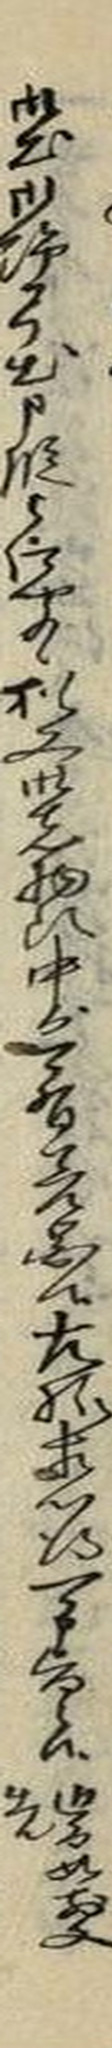御出御飾弓出申段被仰聞候猶又御先物頭中ゟ可有差図候左様相心得可申旨候追而如前文出候
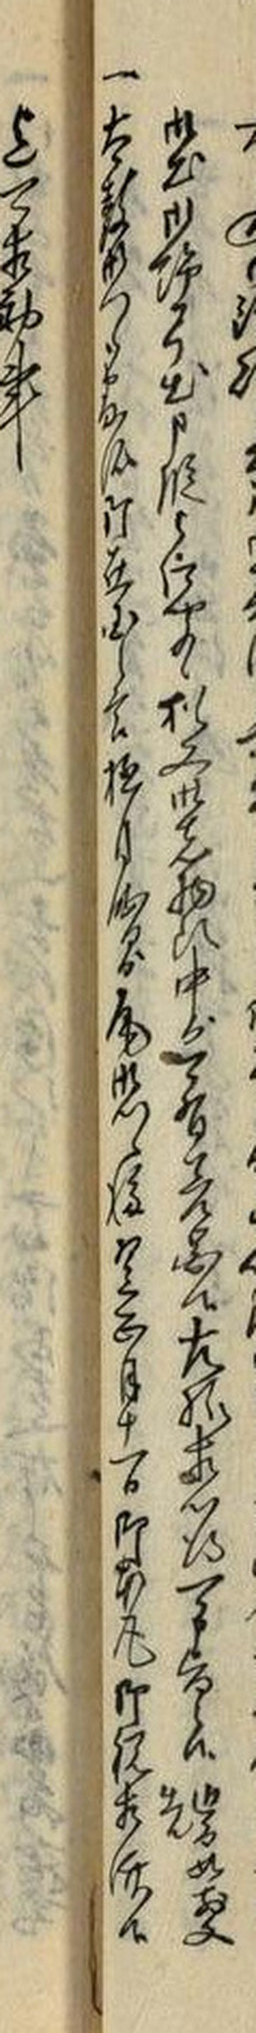一太鼓御門番所御在国之節極月晦日ゟ瓦御門へ移翌正月十一日御本丸御祝相済候
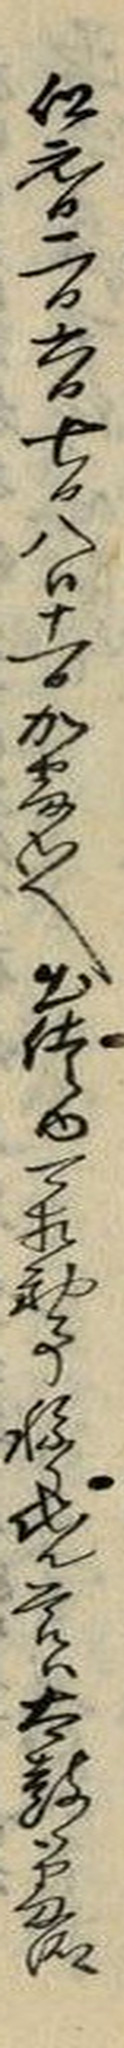但元旦二日六日七日八日十一日加番弐人出仕候内可相勤候事移り代ル節ハ太鼓御番所へ
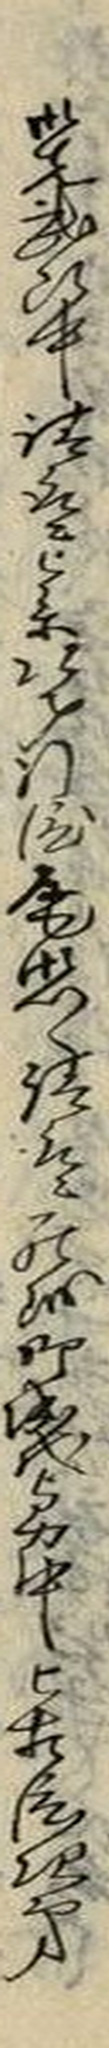御先物頭中請取ニ被参次第引渡瓦御門へ請取ニ罷越御城代与力中被相渡次第
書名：御門御櫓之部
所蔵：福井県文書館 Fukui Prefectural Archives
